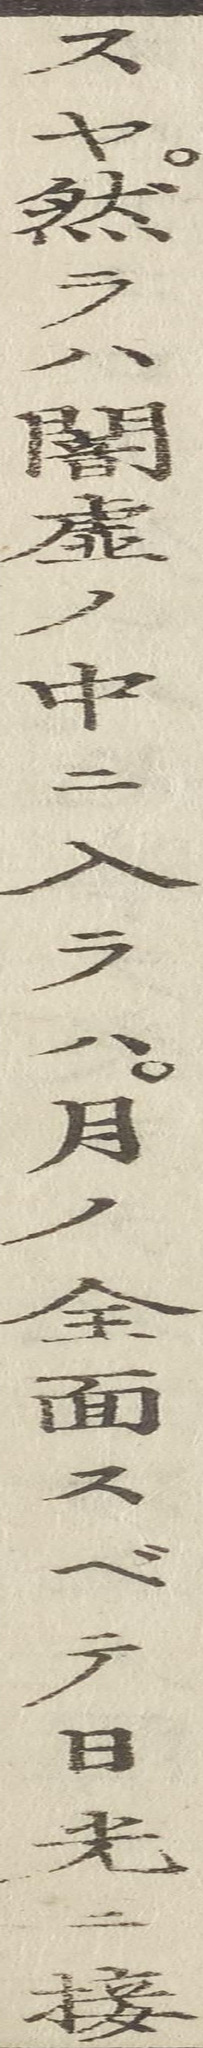スヤ。然ラハ闇虚ノ中ニ入ラハ。月ノ全面スベテ日光ニ接

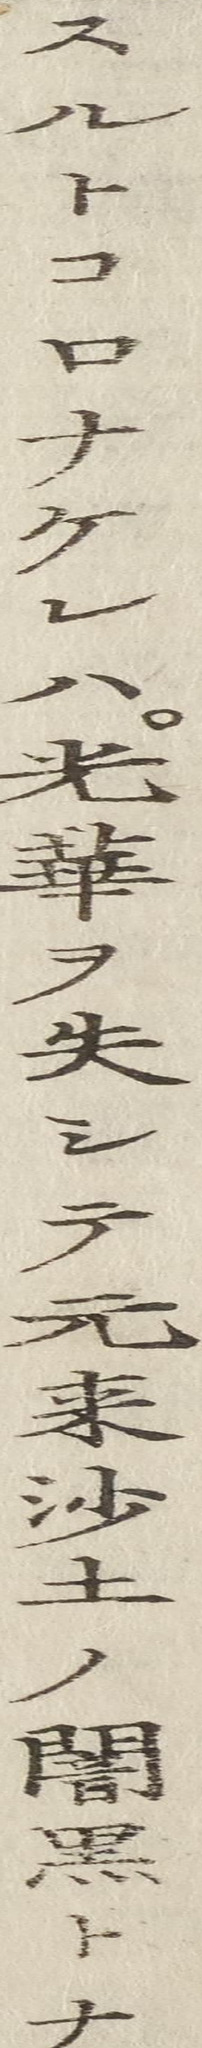スルトコロナケレハ。光華ヲ失シテ元来沙土ノ闇黒トナ
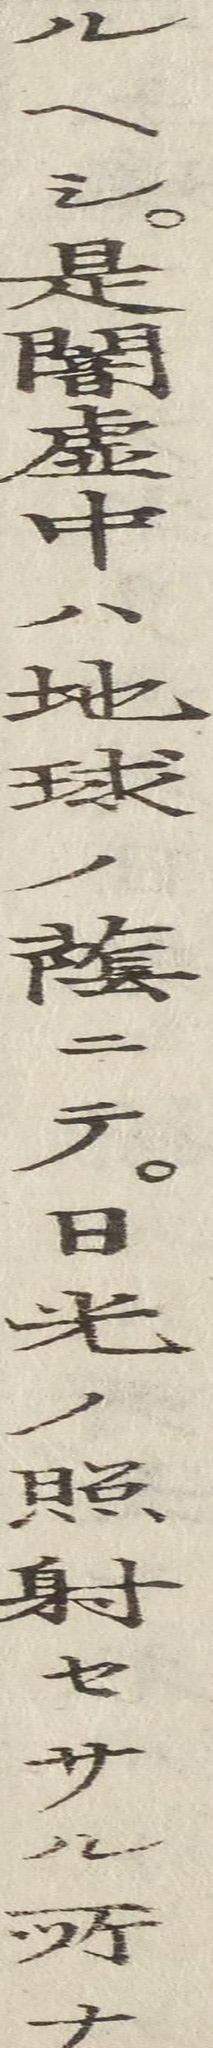ルヘシ。是闇虚中ハ地球ノ蔭ニテ。日光ノ照射セサル所ナ
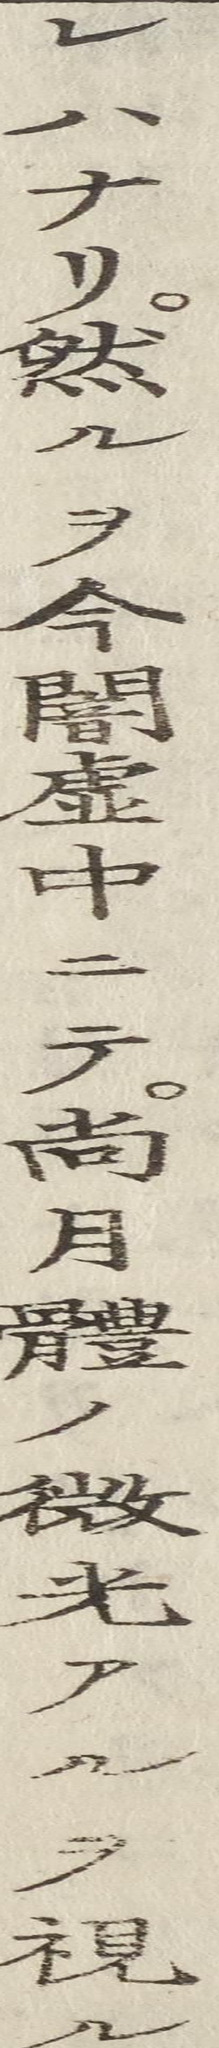レハナリ。然ルヲ今闇虚中ニテ。尚月体ノ微光アルヲ視ル
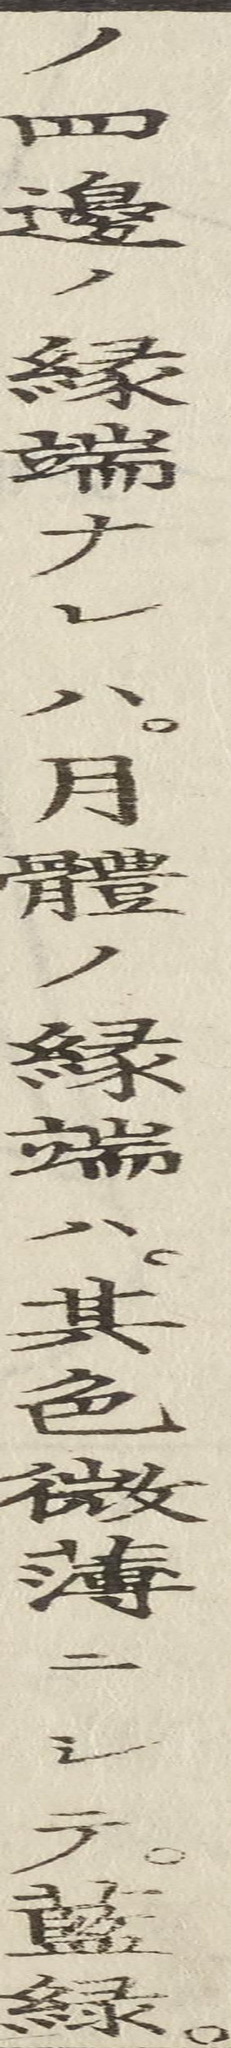ノ四辺ノ縁端ナレハ。月体ノ縁端ハ。其色微薄ニシテ。藍緑。
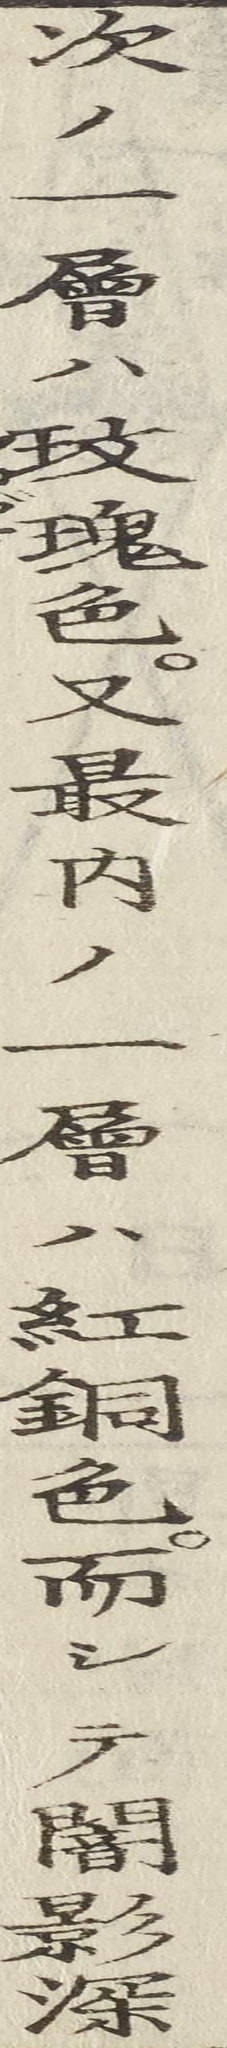次ノ一層ハ玫瑰色。又最内ノ一層ハ紅銅色。而シテ闇影深
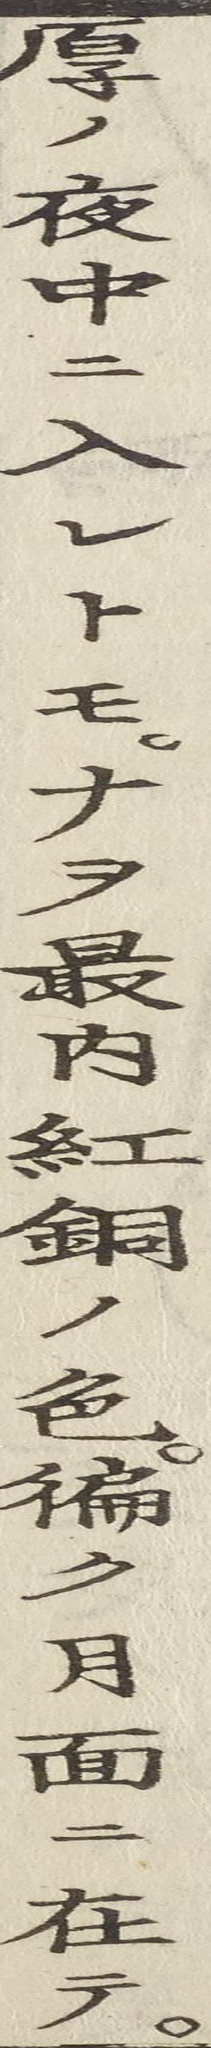厚ノ夜中ニ入レトモ。ナヲ最内紅銅ノ色。徧ク月面ニ在テ。
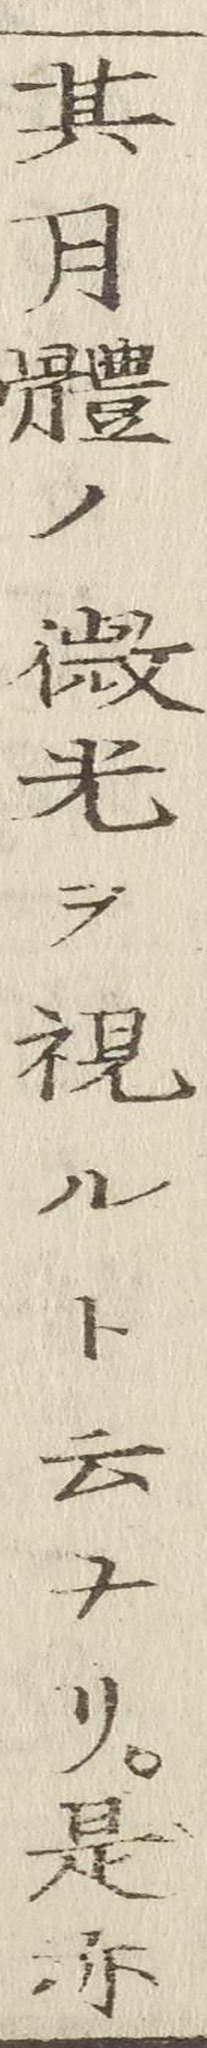其月体ノ微光ヲ視ルト云ナリ。是亦
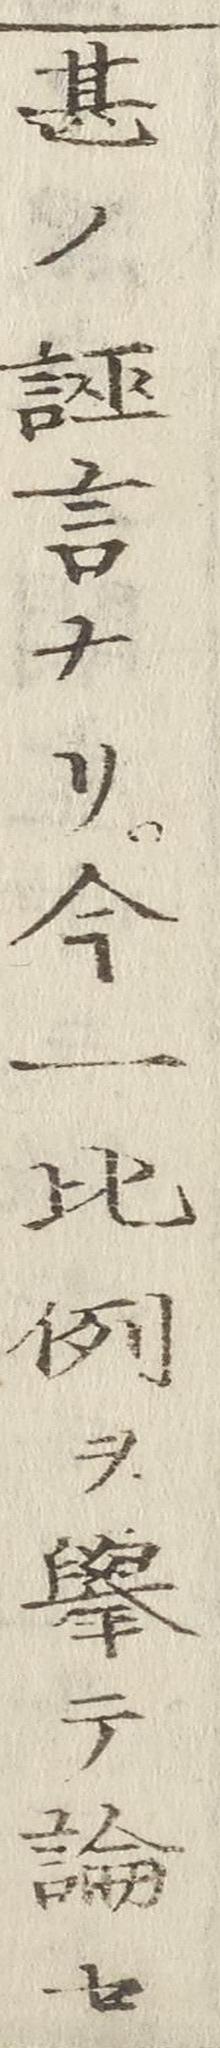甚ノ誣言ナリ。今一比例ヲ挙テ論セ
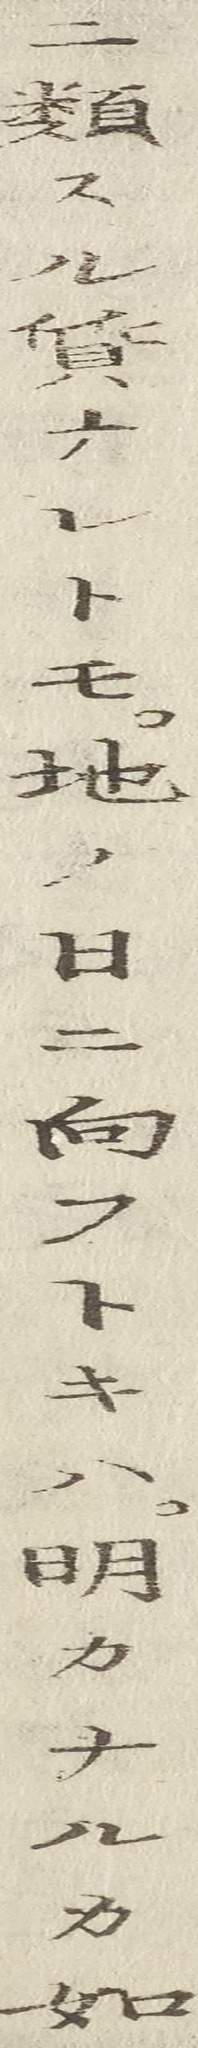ニ類スル質ナレトモ。地ノ日ニ向フトキハ。明カナルカ如
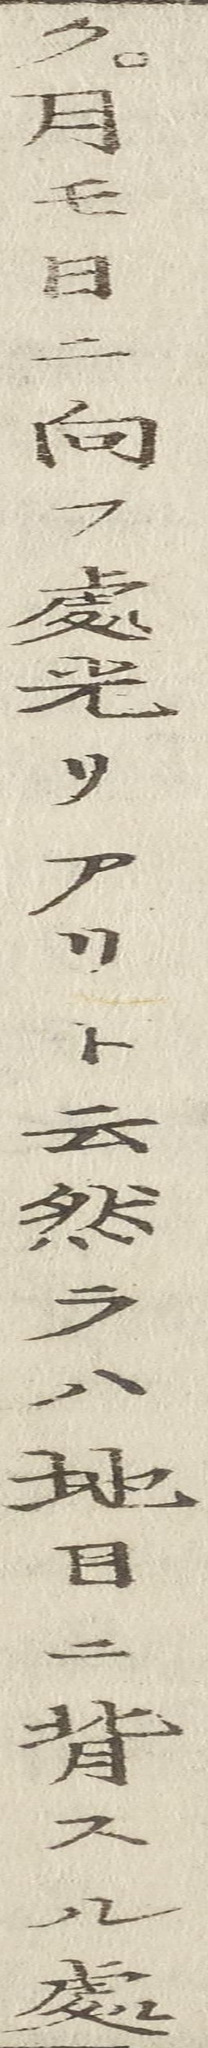ク。月モ日ニ向フ処光リアリト云然ラハ地日ニ背スル処
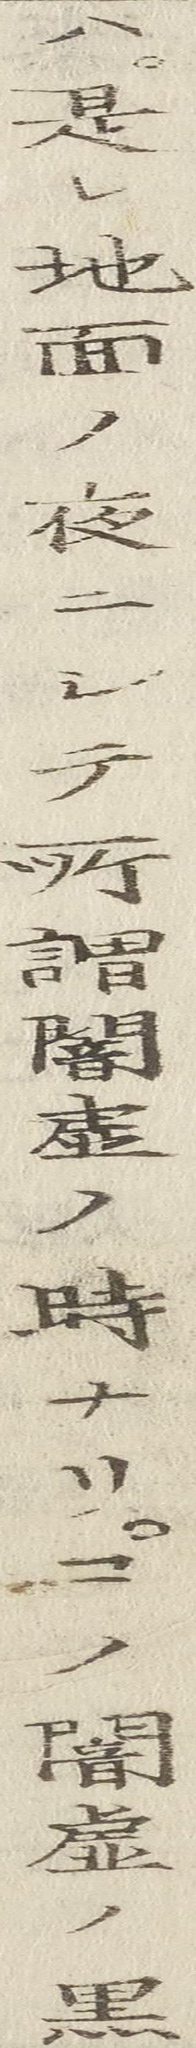ハ。是レ地面ノ夜ニシテ所謂闇虚ノ時ナリ。コノ闇虚ノ黒
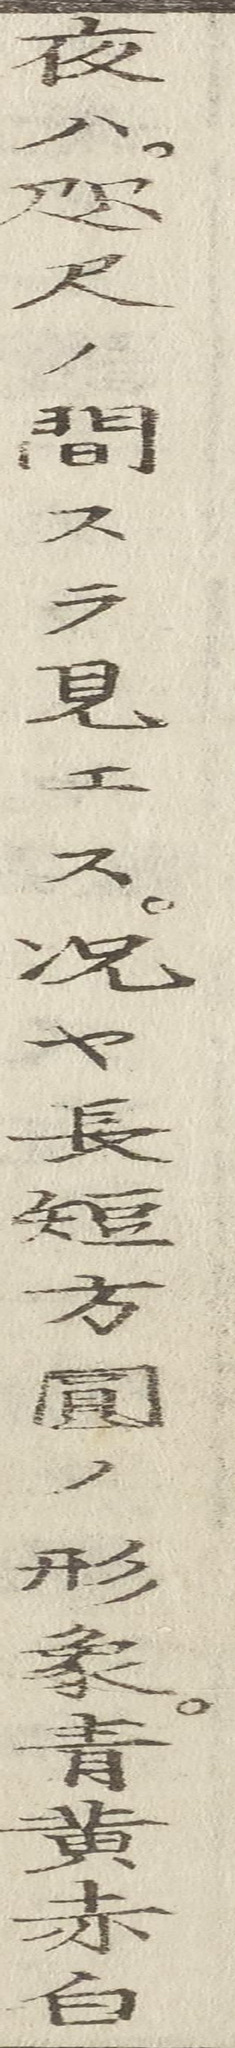夜ハ。咫尺ノ間スラ見エス。況ヤ長矩方円ノ形象。青黄赤白
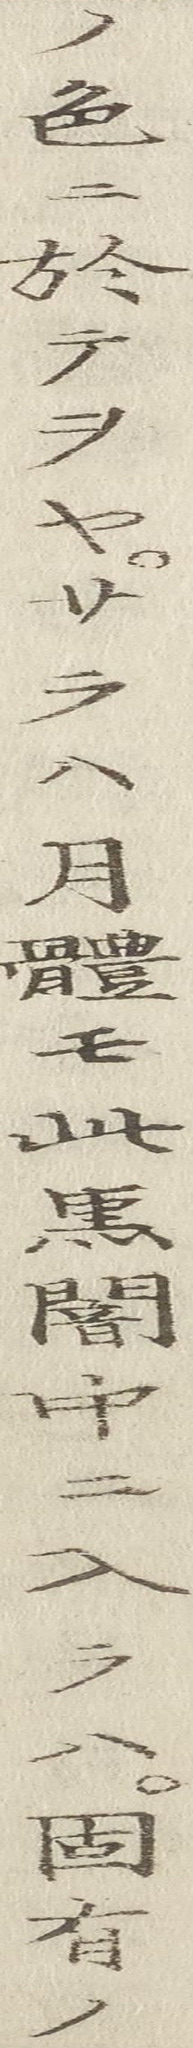ノ色ニ於テヲヤ。サラハ月体モ此黒闇中ニ入ラハ。固有ノ
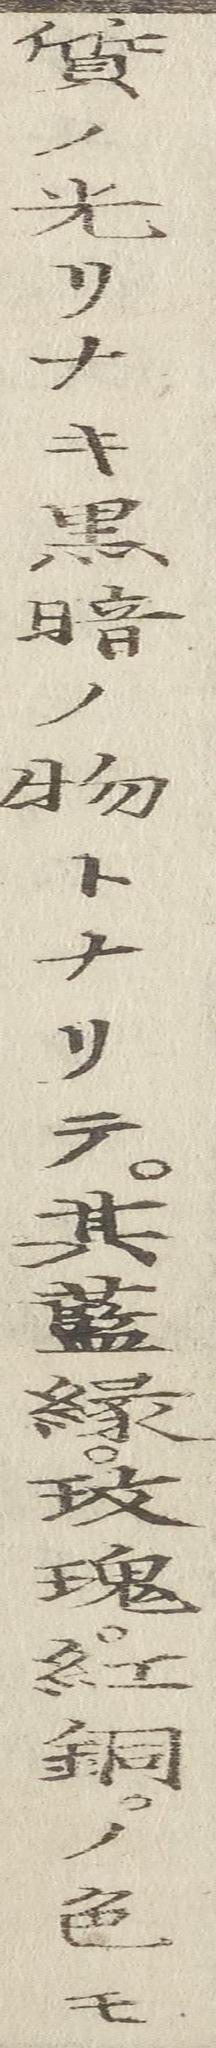質ノ光リナキ黒暗ノ物トナリテ。其藍緑。玫瑰。紅銅。ノ色モ

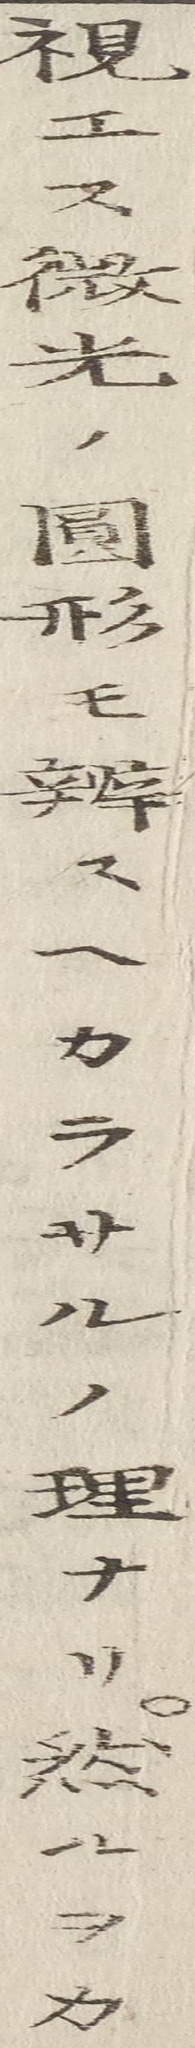視エス微光ノ円形モ弁スヘカラサルノ理ナリ。然ルヲカ
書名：護法新論　二編　下
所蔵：東京大学地震研究所図書室 Earthquake Research Institute Library, The University of Tokyo, JAPAN
